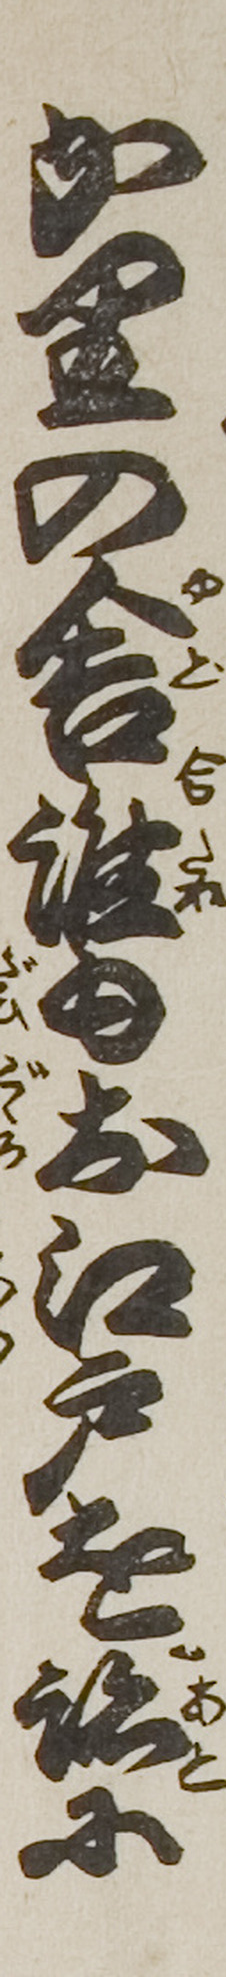かりの舎誰もお江戸を後に
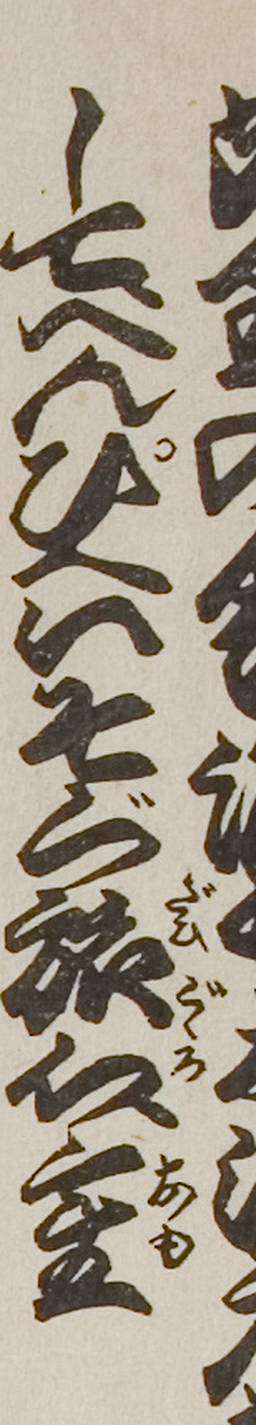して、へんぴへいそぐ旅心重
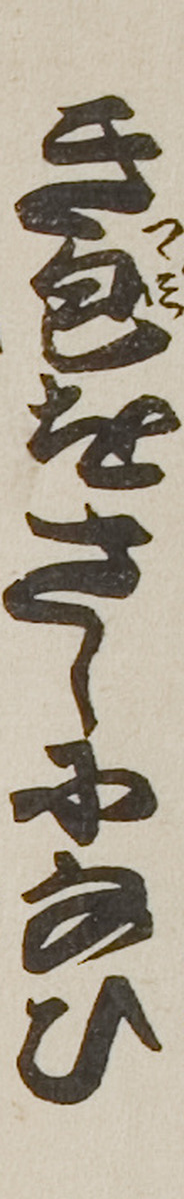き包をさしになひ
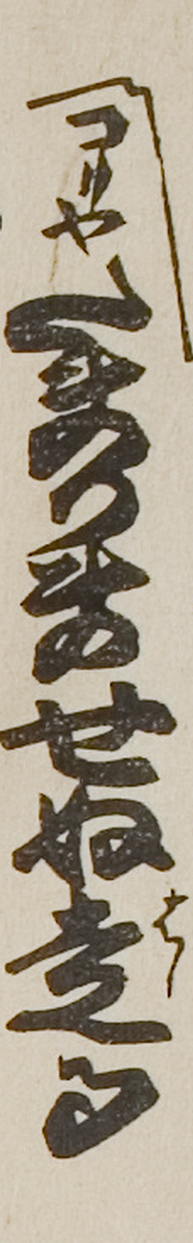〽コリヤたまりませぬ走る
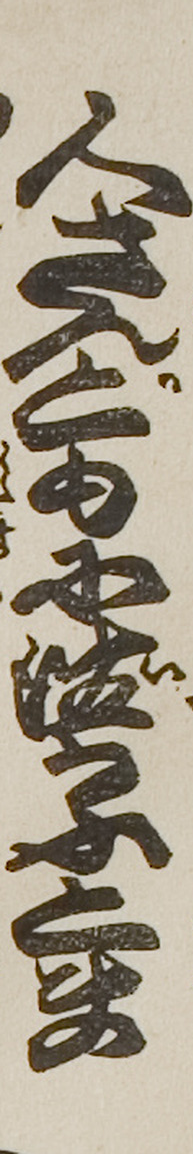人さんどもに往うふとま
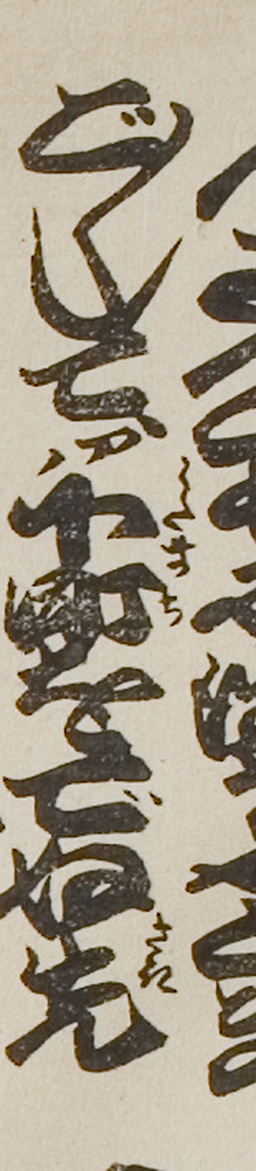ご〳〵して、アノ下町をでぬ先
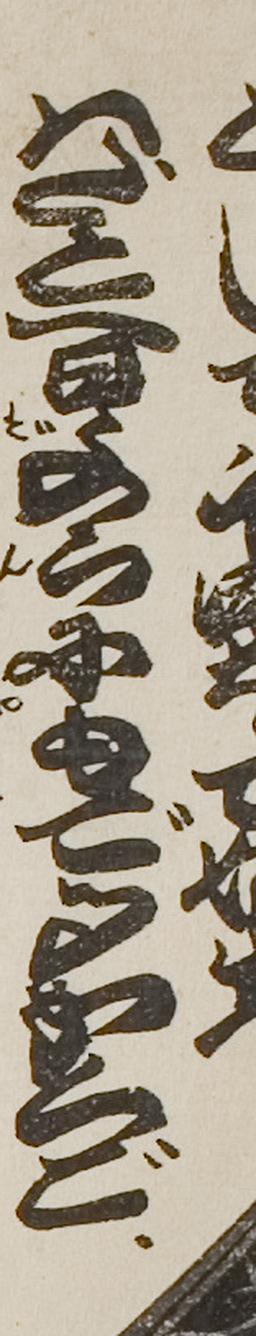ハ、たとへ日ゝのらにもでるかくご、
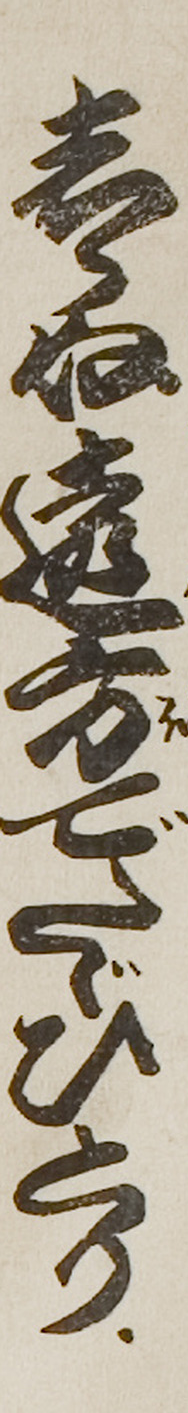しらぬ遠方でたゞひとり、
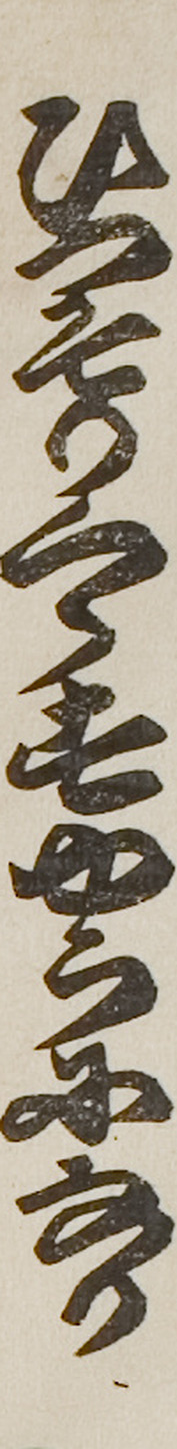ひつそりつゝすやうになり、
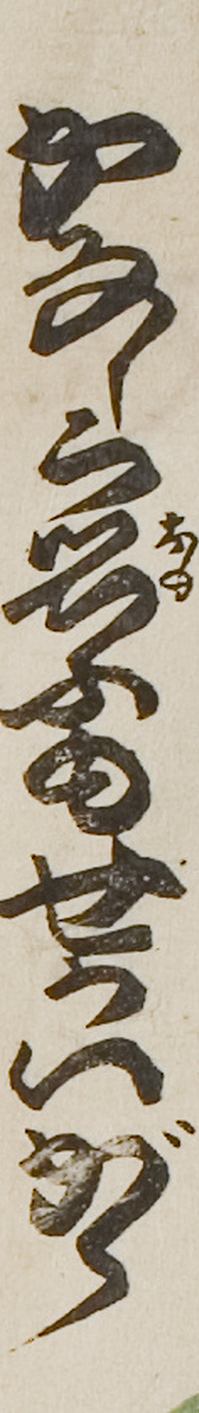かなしう思ふもせかいが
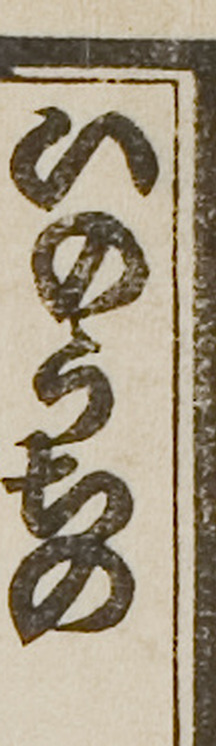いのうちの
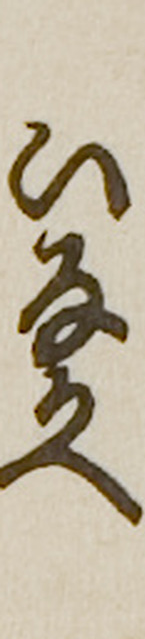いなかへ
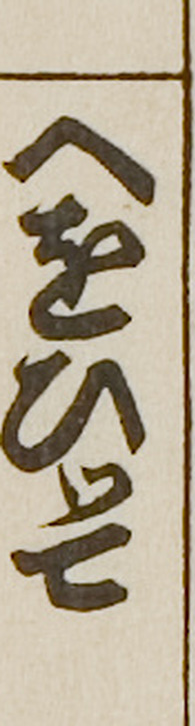へをひって
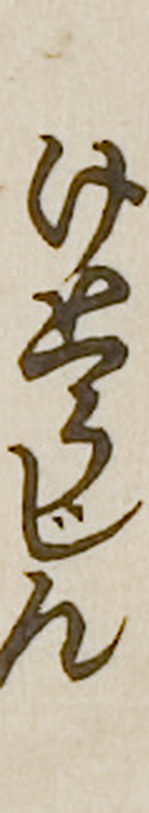けとうじん
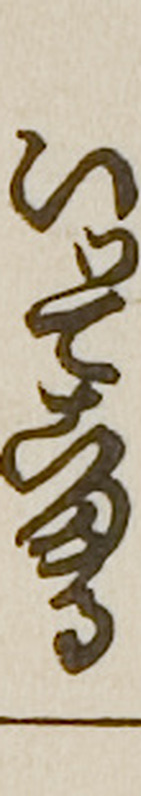いってこまる
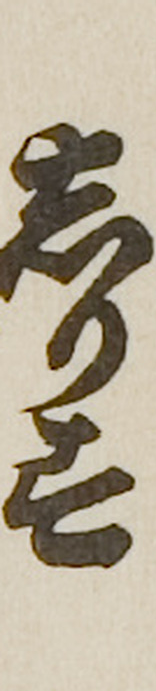しりす
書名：当時流行いろは壁
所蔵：東京大学総合図書館 General Library in the University of Tokyo, JAPAN
